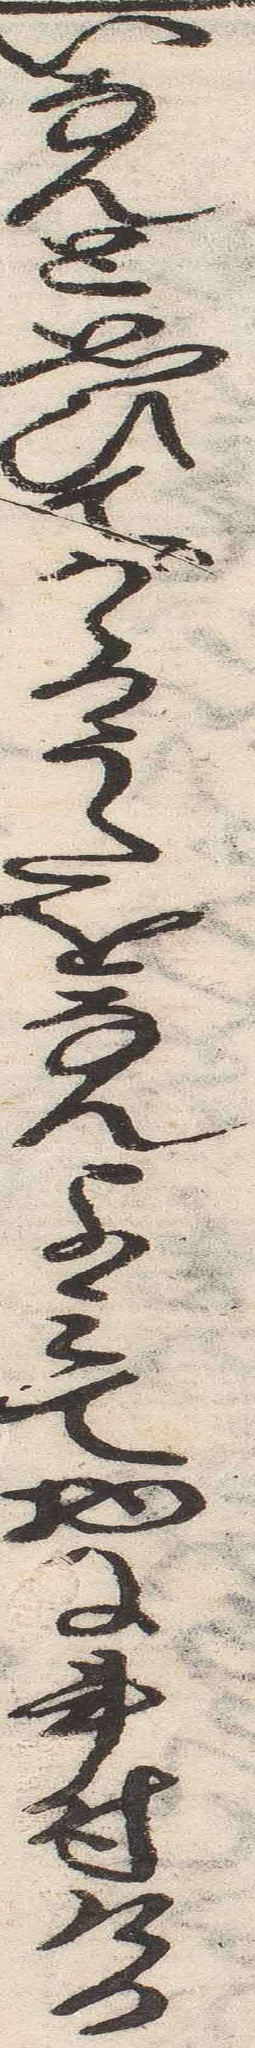いなんと思ひて。かゝるうたをなんよみて物に書付ける
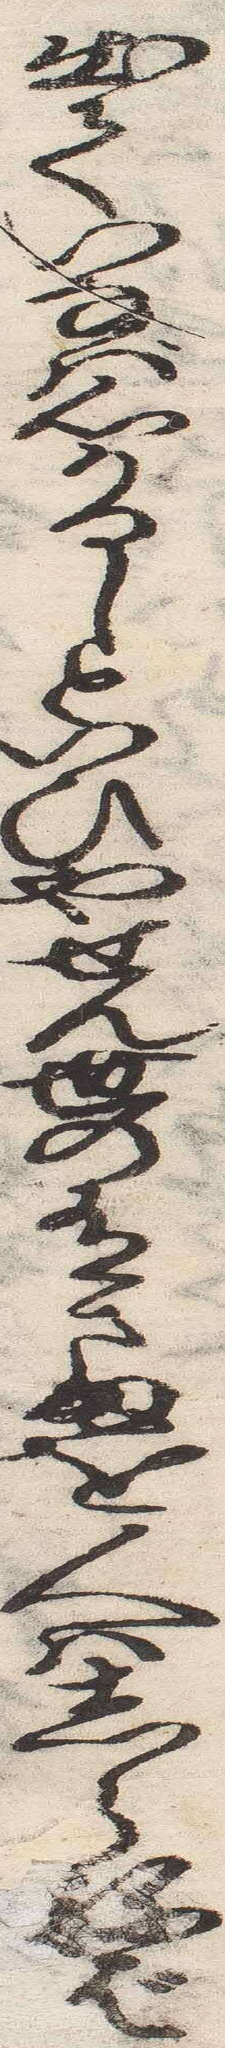出ていなば心かるしといひやせん世の有さまを人はしらねば
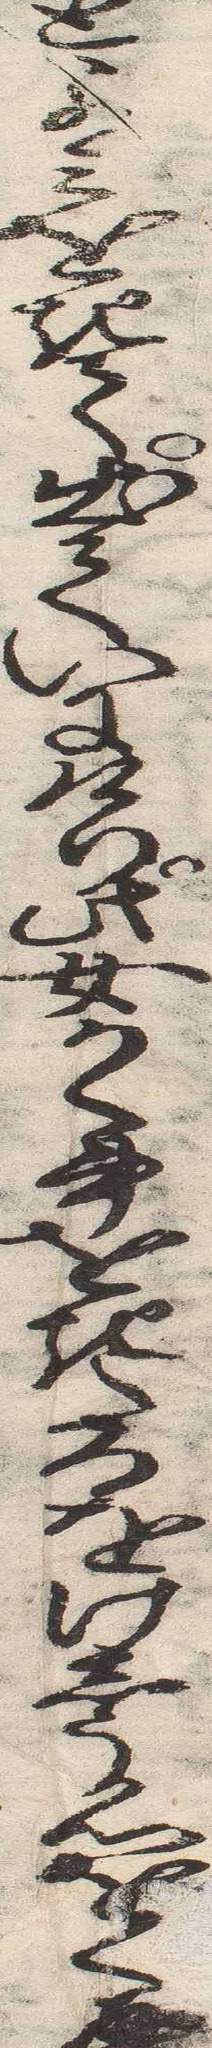とよみをきて。出ていにけり。此女かく書をきたるをけしう心をくへ
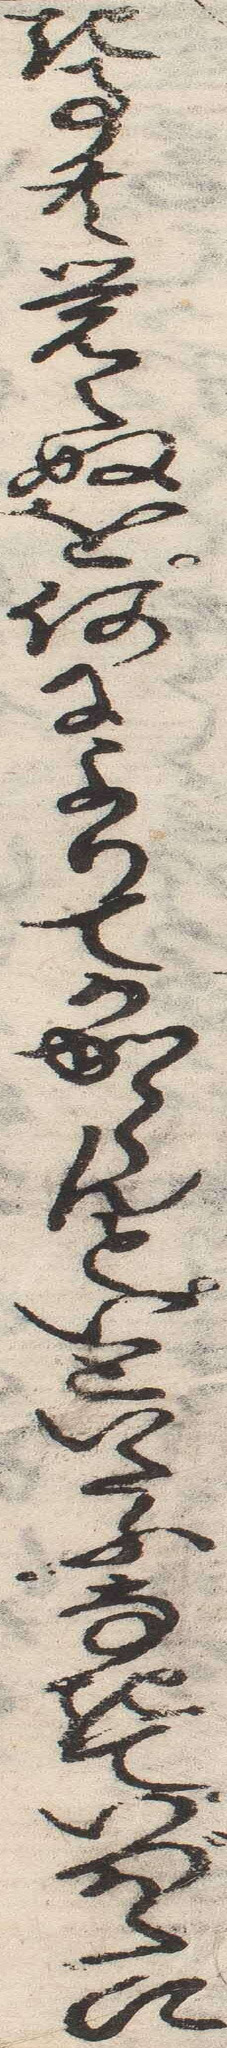き事共覚えぬを。何によりてかかゝらんと。いといたふなきて。いづかたに
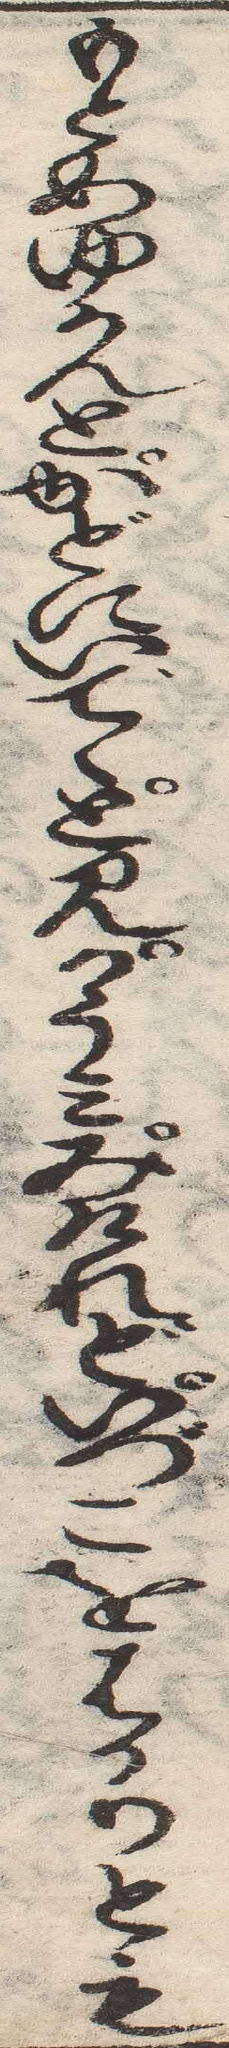もとめゆかんと。かどにいでゝ。と見。かうみ。みけれど。いづこをはかりとも
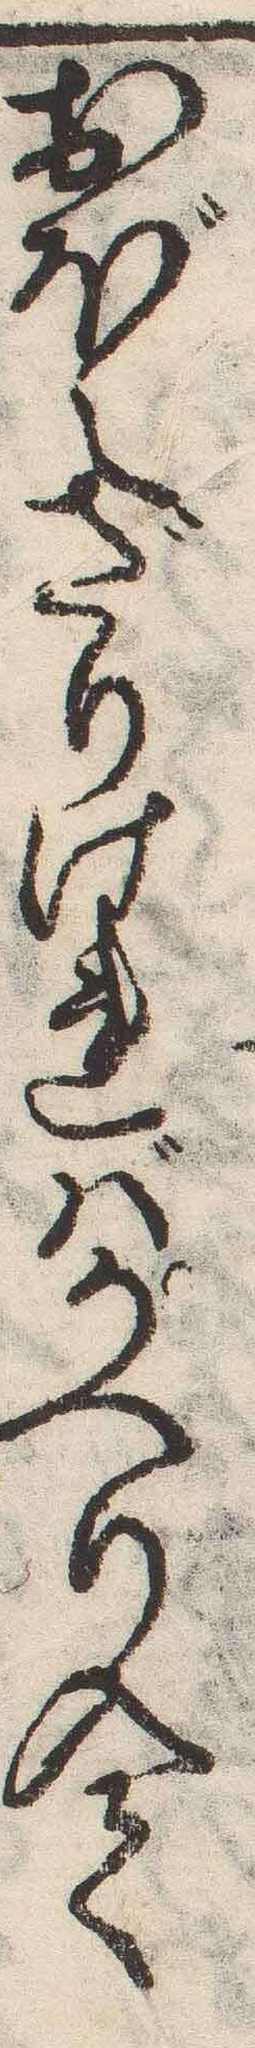おぼえざりければ。かへり入て
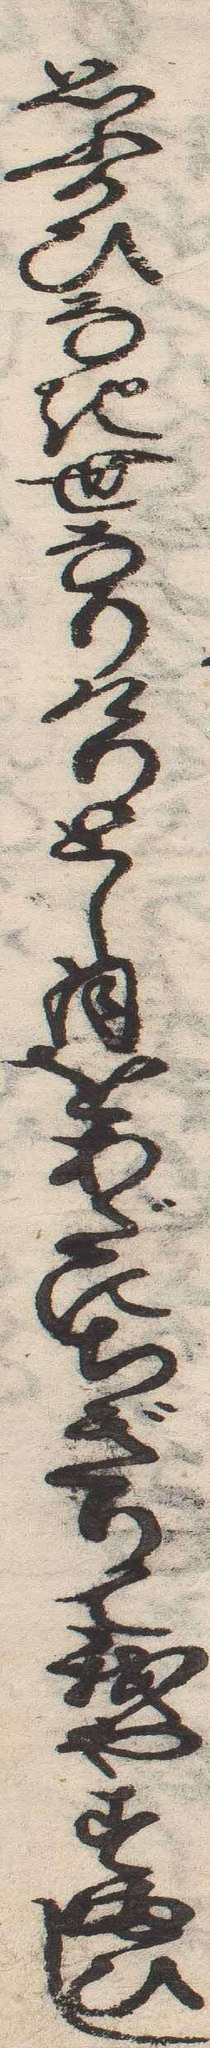思ふかひなき世なりけりとし月をあだにちぎりて我やすまひし
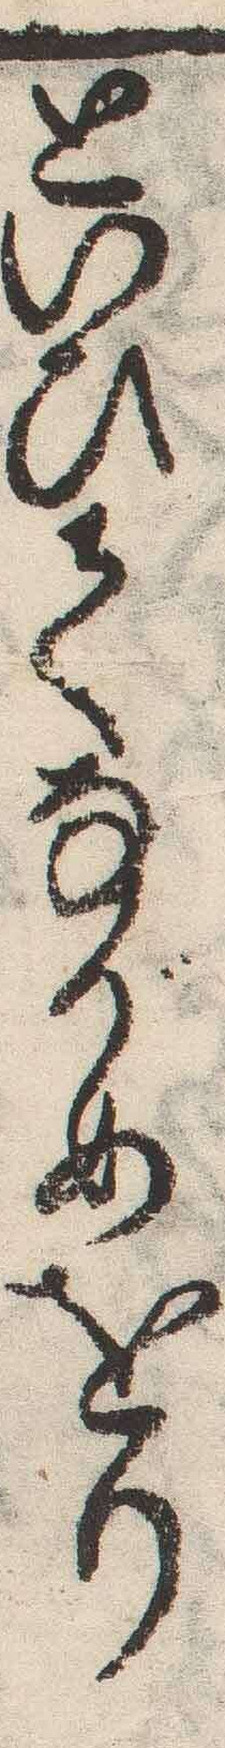といひてながめをり
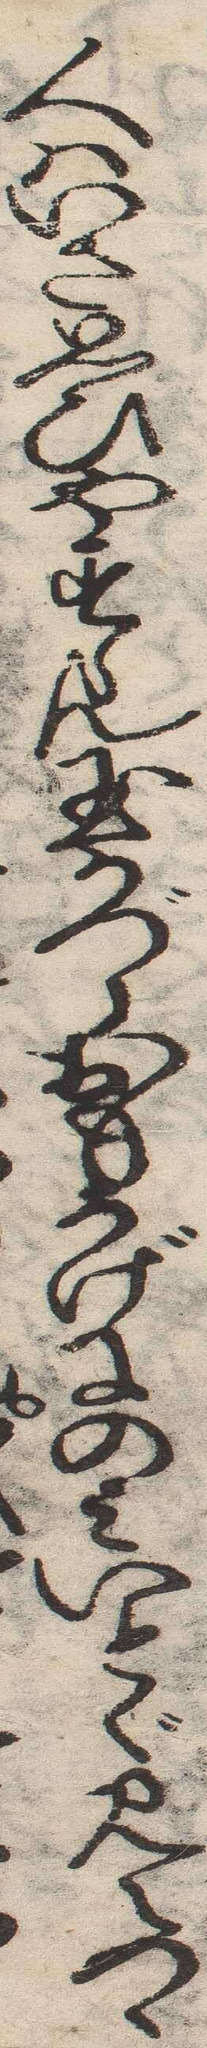人はいさ思ひやすらん玉かづらおもかげにのみいとゞ見えつゝ
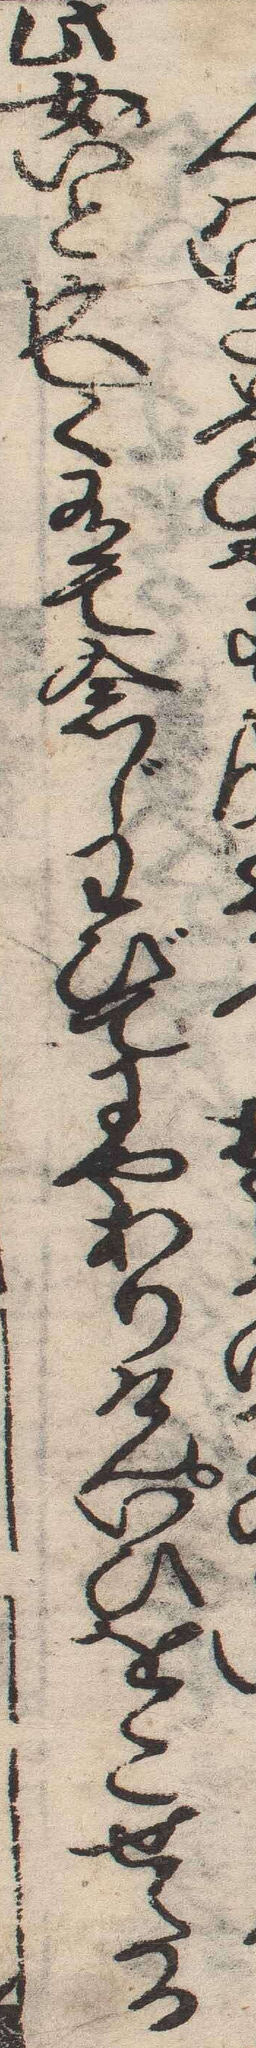此女いと久しく有て念じわびてにやありけん。いひをこせたる

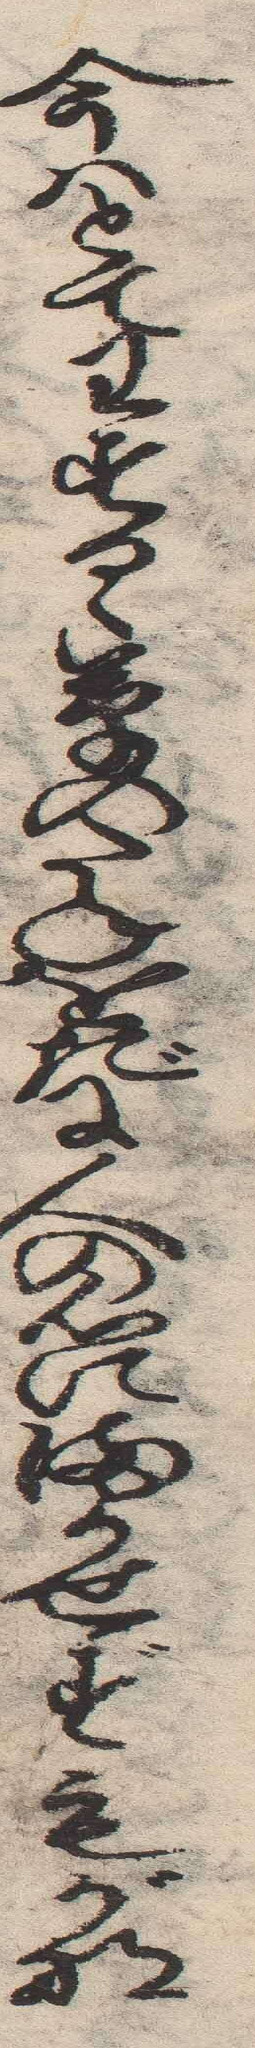今はとてわするゝ草のたねをだに人の心にまかせずもがな
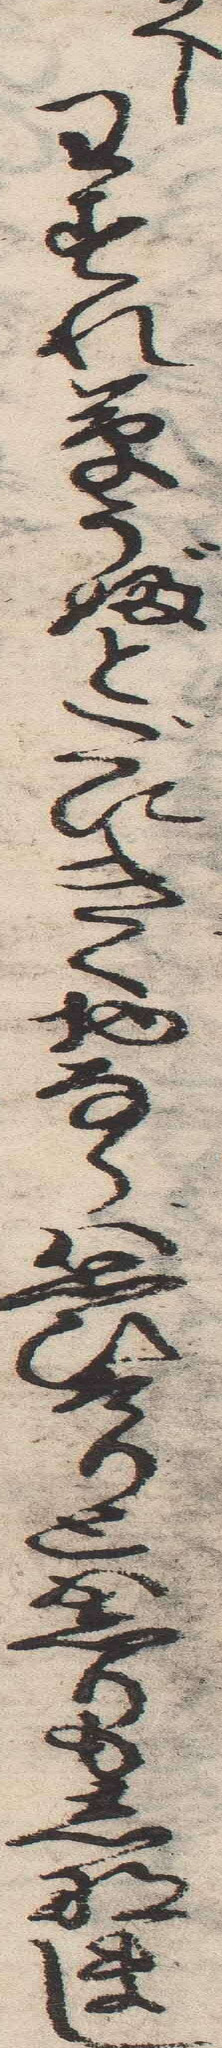わすれ草うぶとだにきく物ならは思ひけりとはしりもしなまし
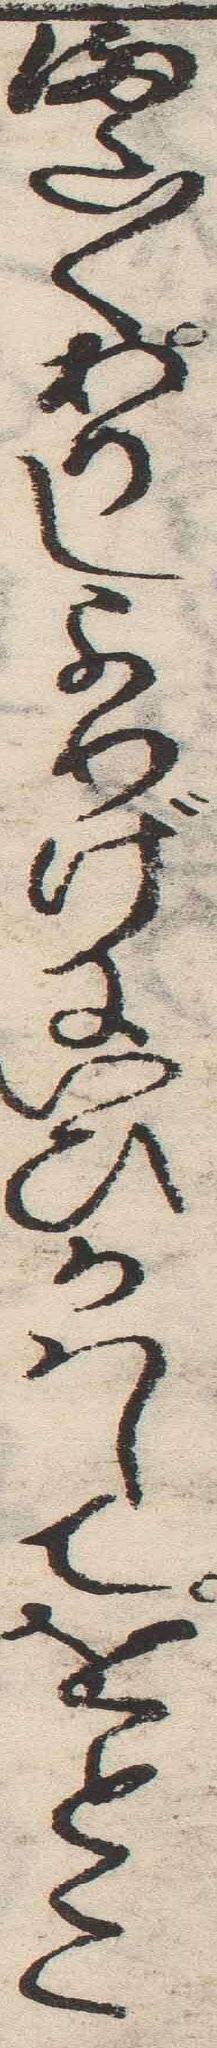また〳〵。ありしよりげにいひかはして。をとこ
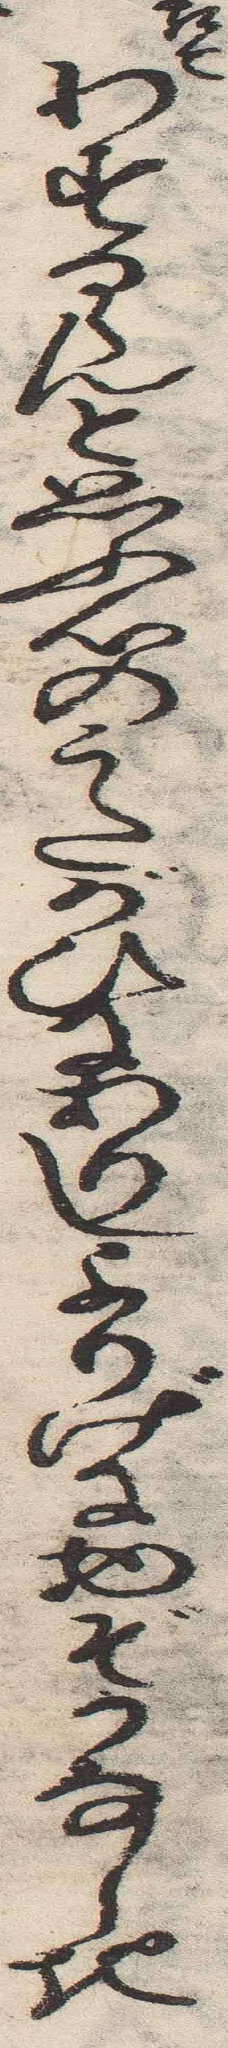新古今わするらんと思ふ心のうたがひにありしよりげに物ぞかなしき
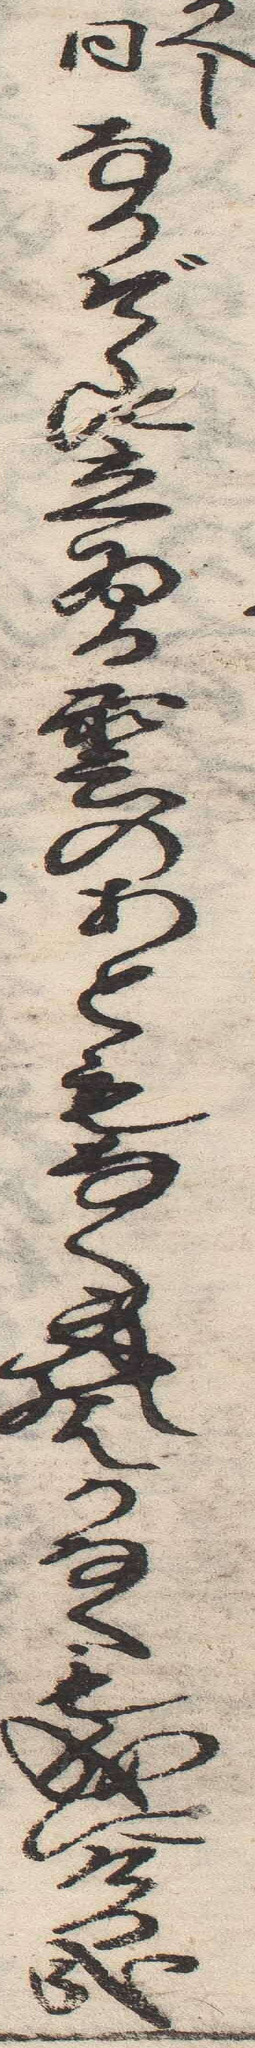同なかぞらに立ゐる雲のあともなく身のはかなくも成にける哉
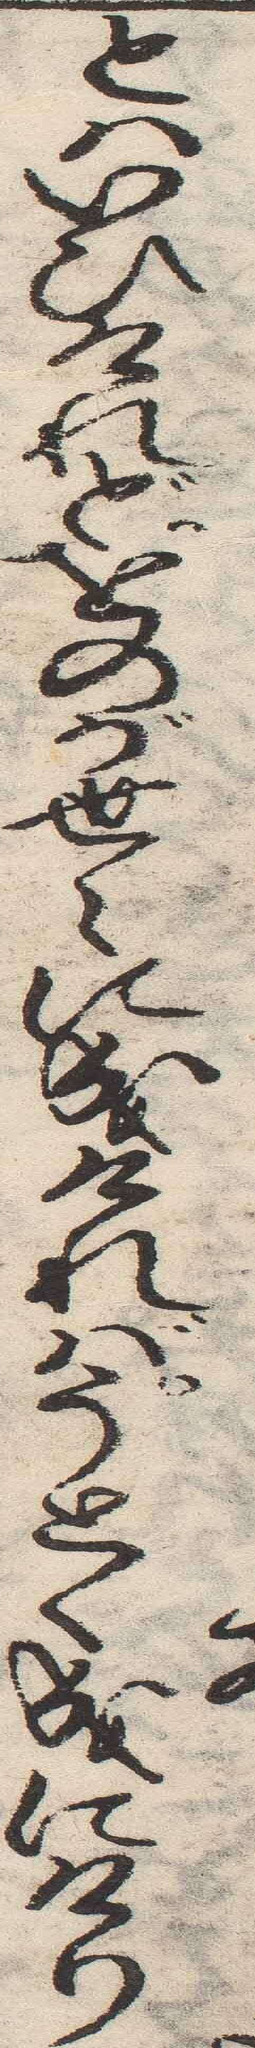とはいひけれど。をのが世々に成ければ。うとく成にけり
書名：伊勢物語
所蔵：東京学芸大学附属図書館 国文学研究資料館
